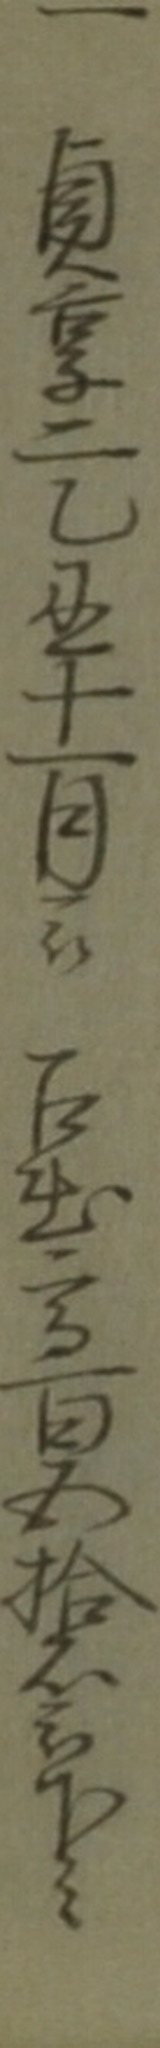一貞享二乙丑十一月被召出高百五拾石被下之
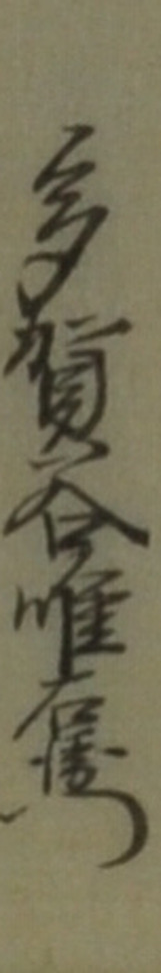多賀谷唯右衛門
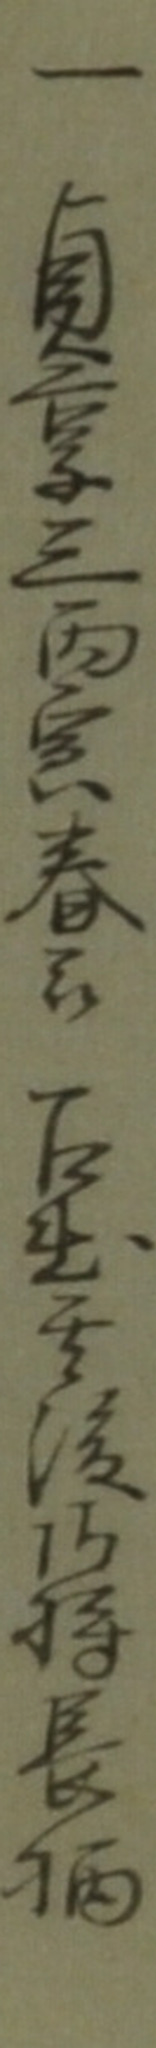一貞享三丙寅春被召出其後御持長柄
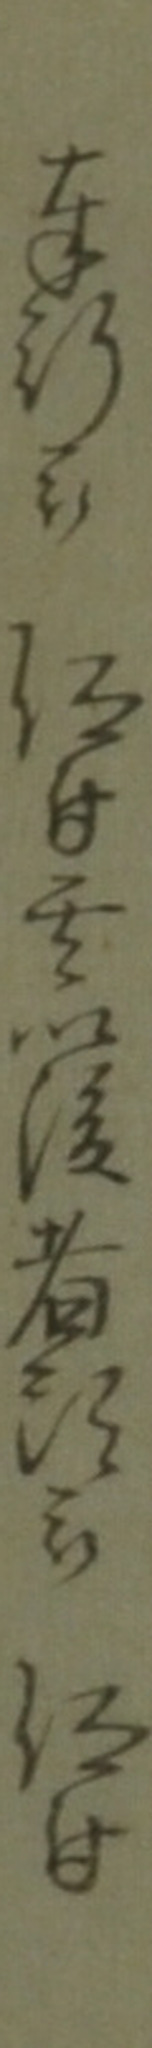奉行被仰付其以後者頭被仰付
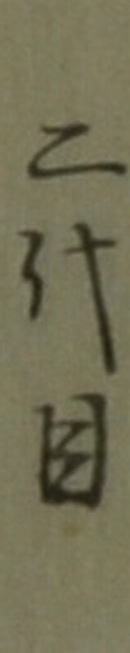二代目
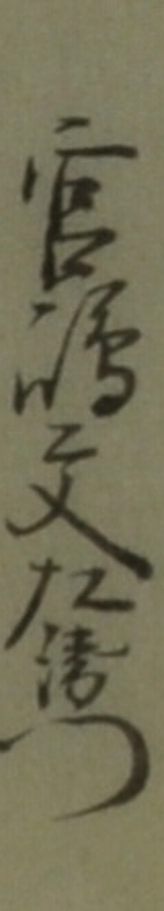宮嶋文左衛門
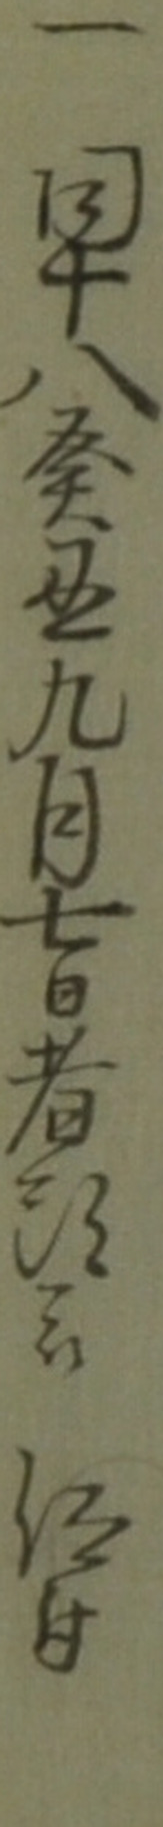一同十八癸丑九月七日者頭被仰付
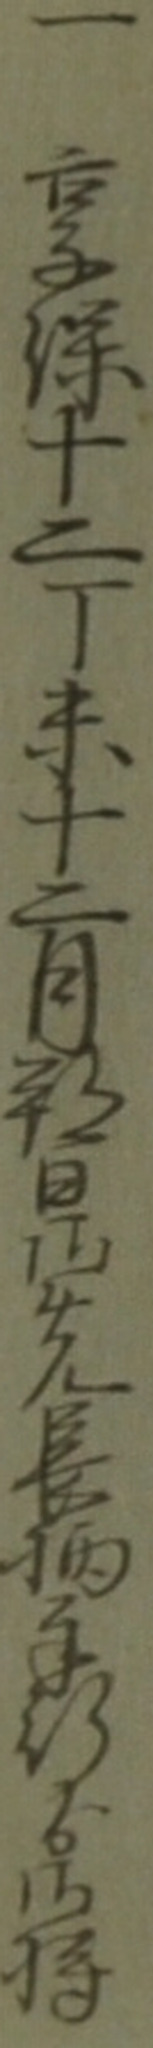一享保十二丁未十二月朔日御先長柄奉行ゟ御持
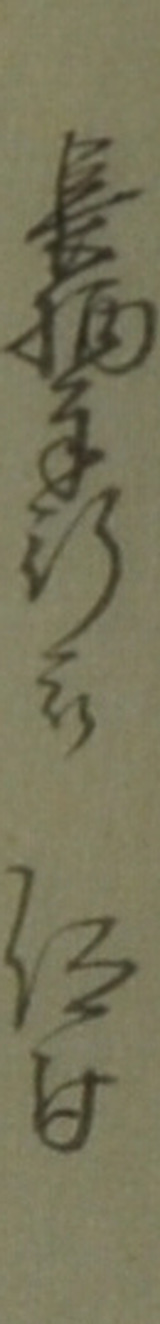長柄奉行被仰付
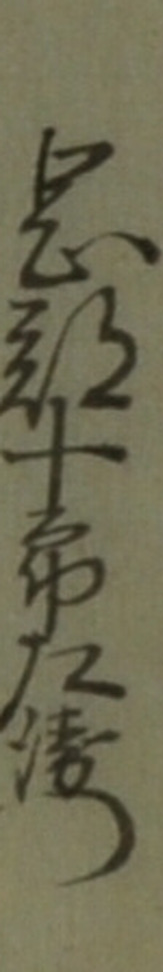岡部十郎左衛門

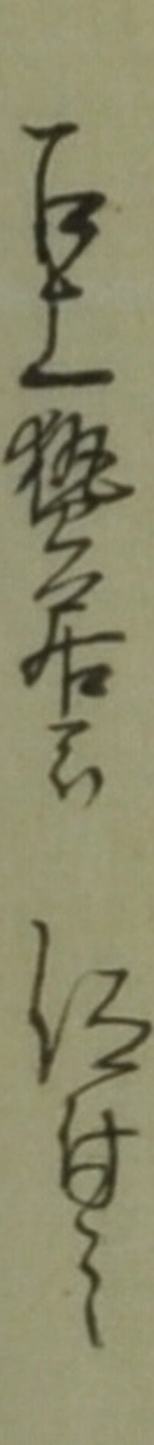召上蟄居被仰付之
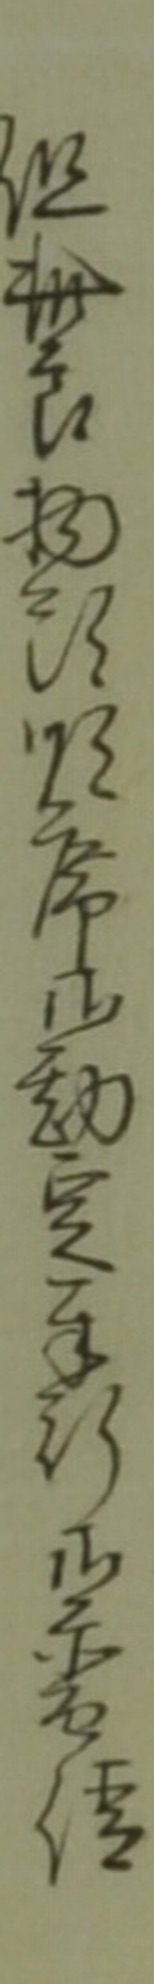但此節物頭順席御勘定奉行御普請
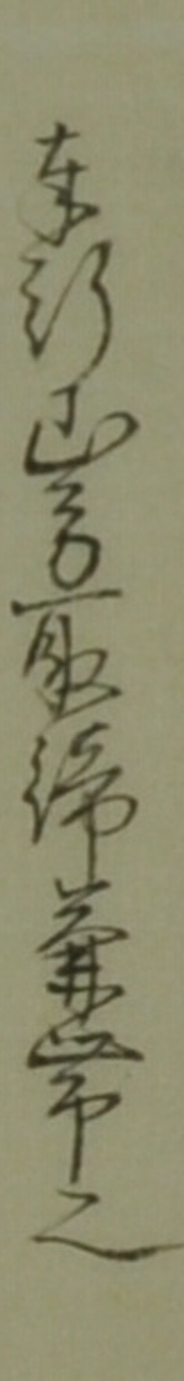奉行山方取締兼帯也
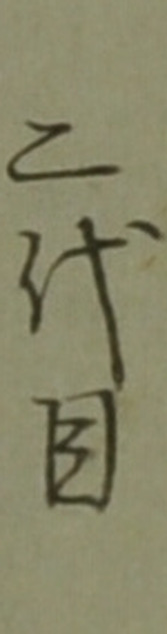二代目
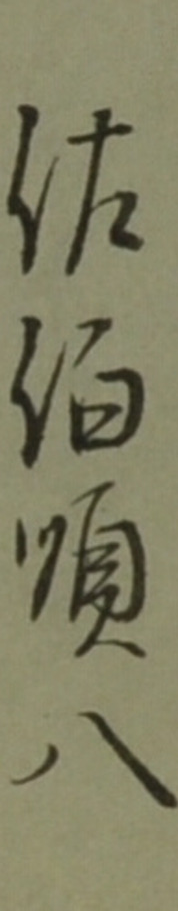佐伯順八
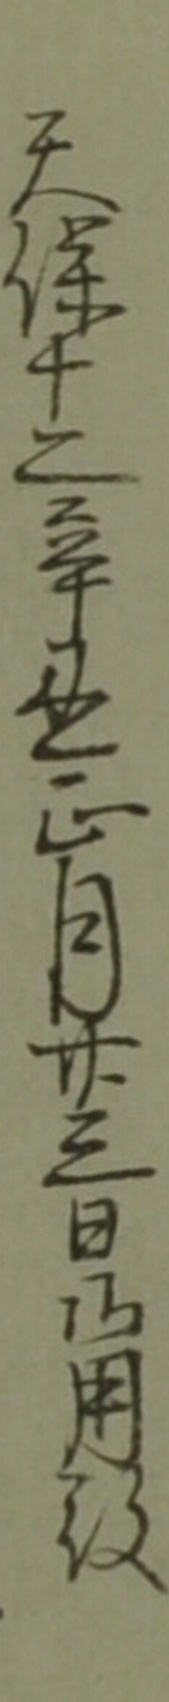一天保十二辛丑正月廿三日御用役
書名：諸御役代々録（三）
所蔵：伊那市立高遠町図書館・合同会社AMANE
